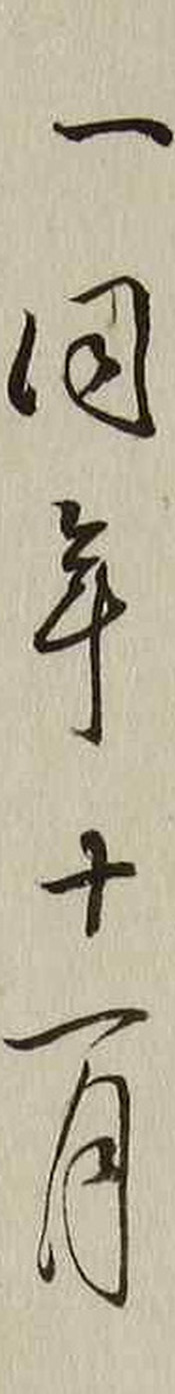一同年十一月
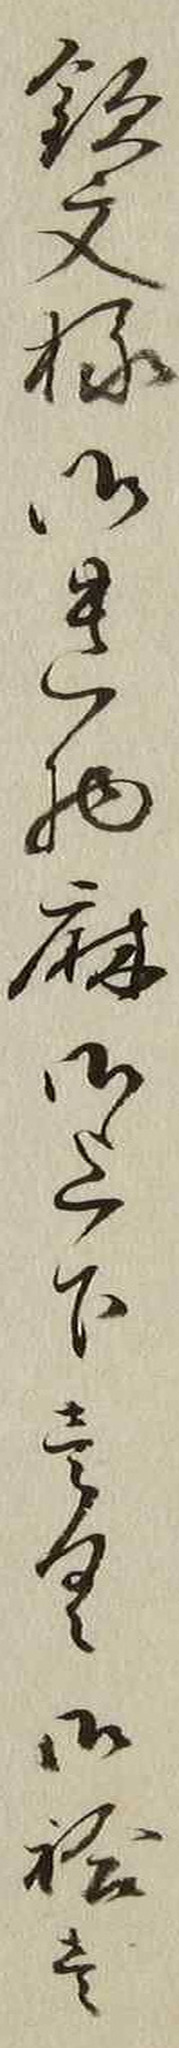欽文様御遺物麻御上下壱具御袷壱
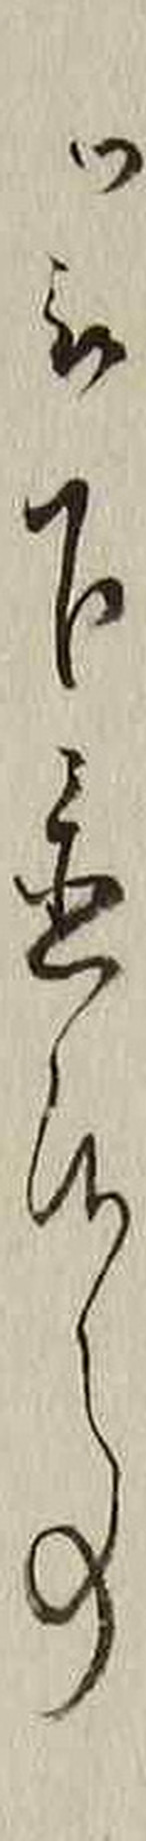被下置候事
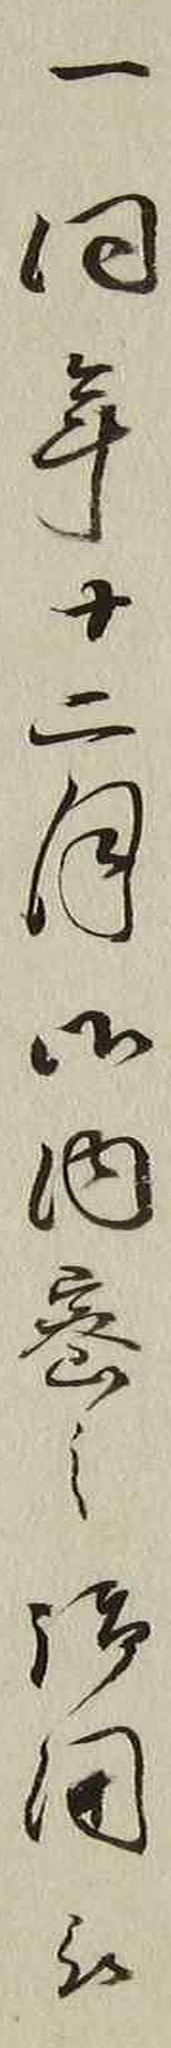一同年十二月御内密之御用被
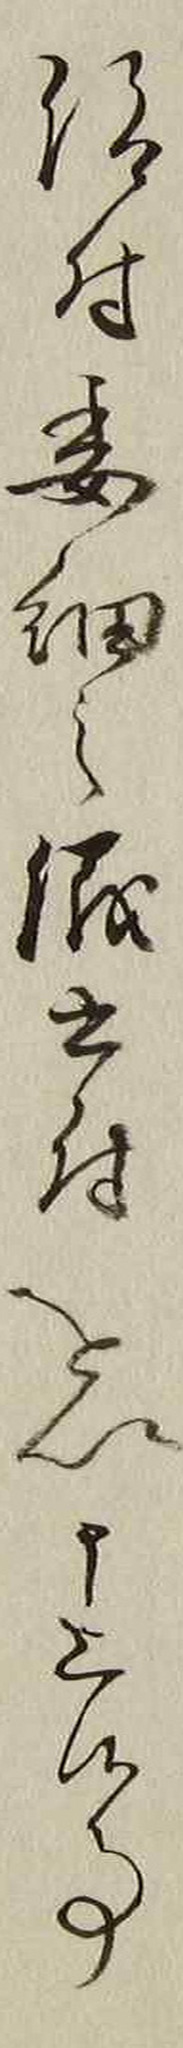仰付委細之儀書付を以申上候事
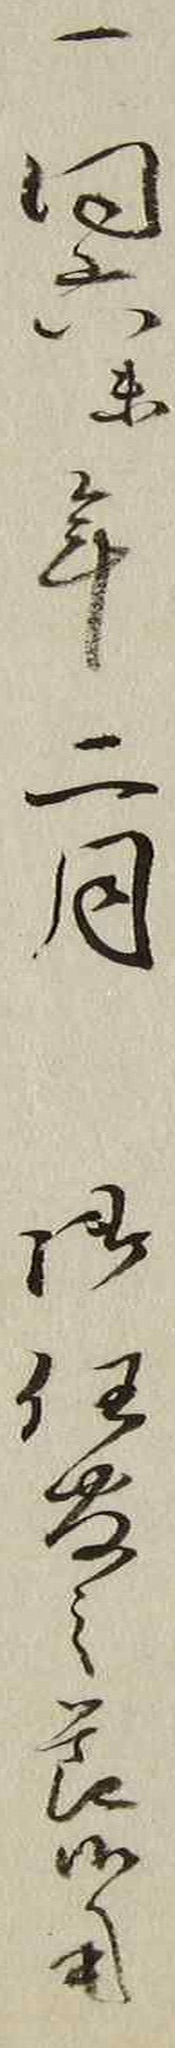一同六未年二月御任官之節御用
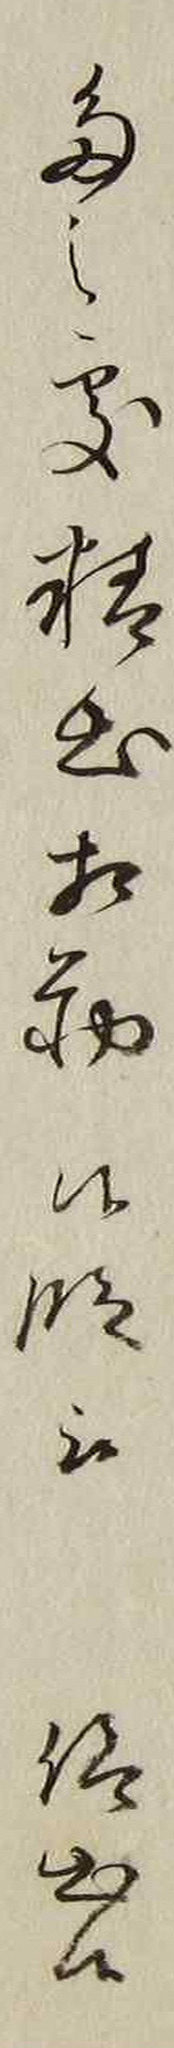多之処精出相勤候段被仰出候
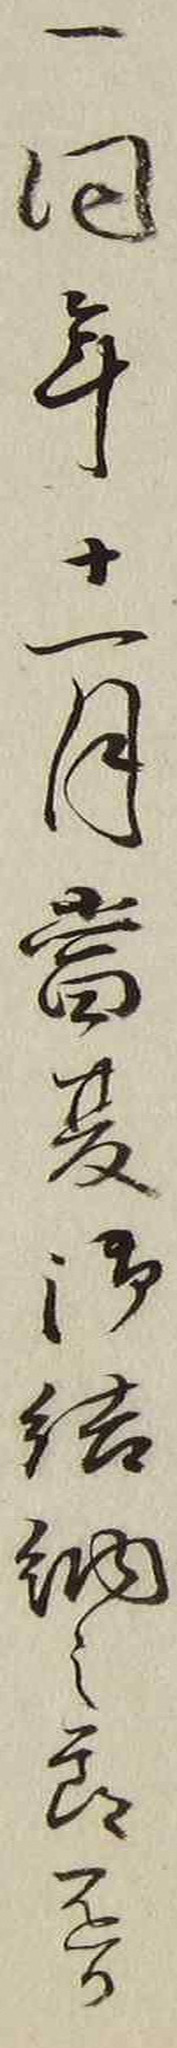一同年十一月当夏御結納之節懸り
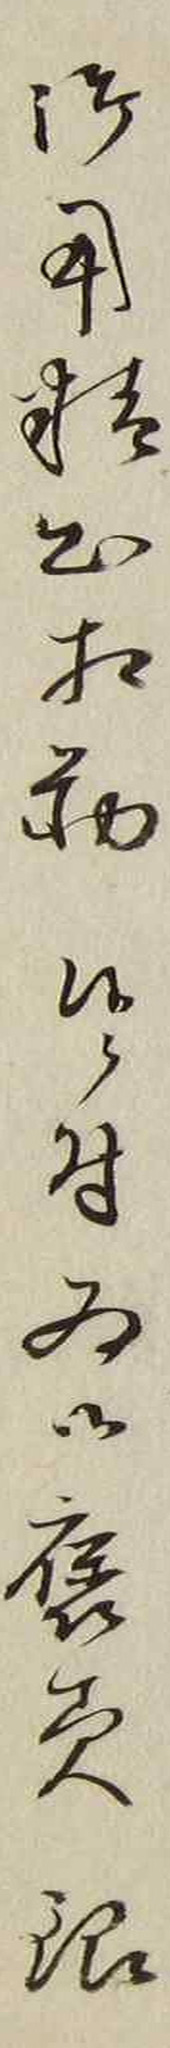御用精出相勤候ニ付為御褒美銀

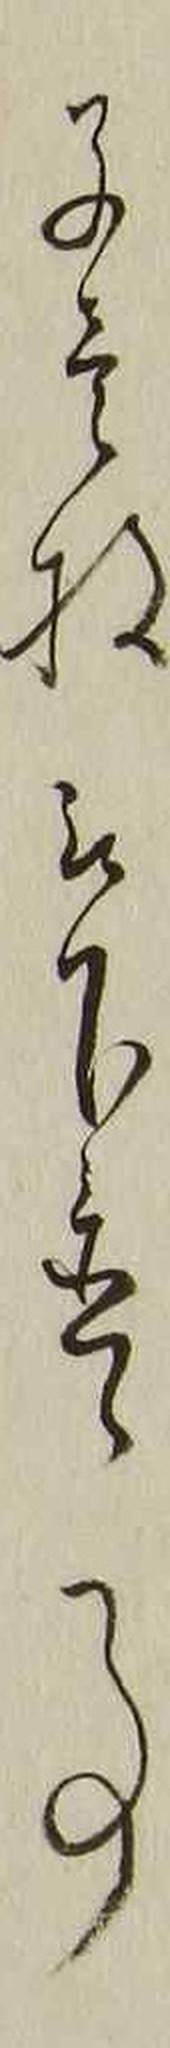子壱枚被下置候事
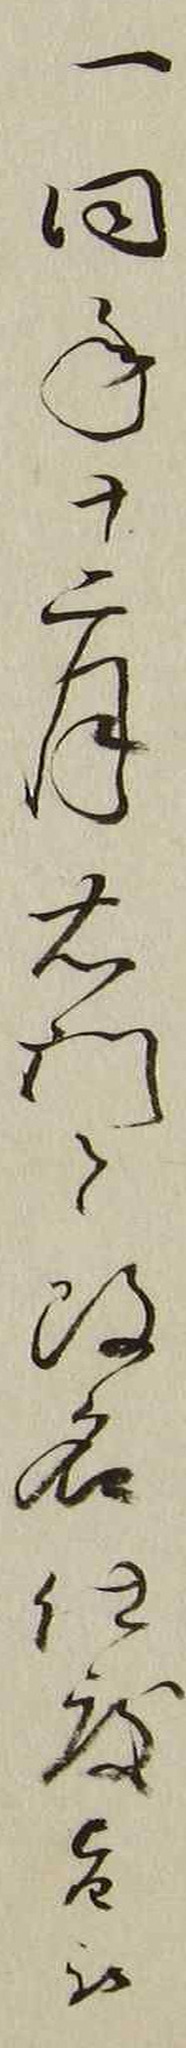一同年十二月右門と改名仕度旨被
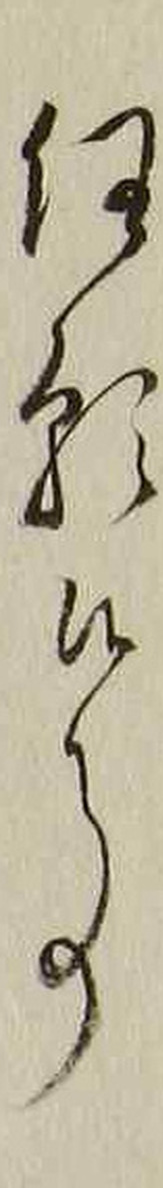任願候事
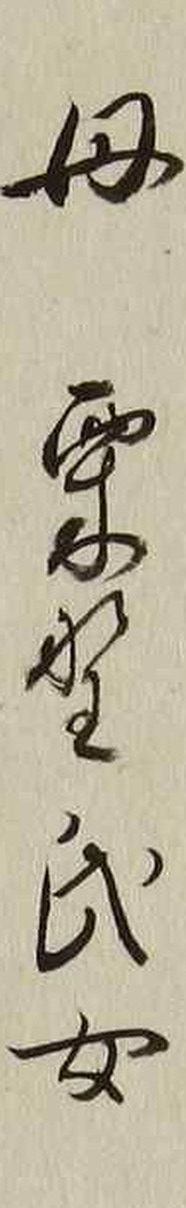母栗野氏女
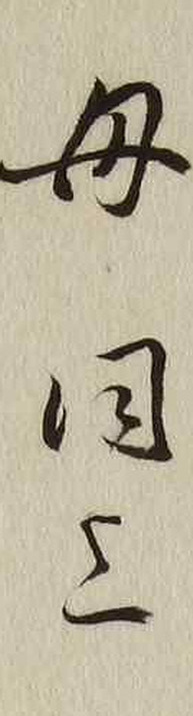母同上
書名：諸士系譜　巻之4　い之部4
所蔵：会津若松市立会津図書館
